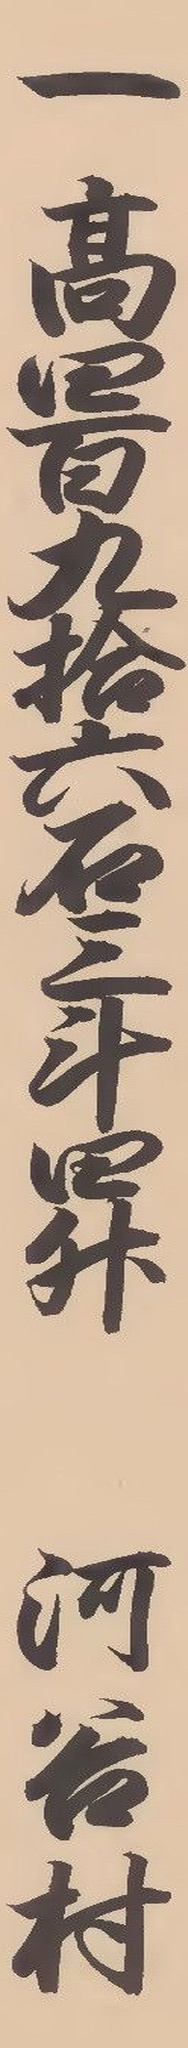一高四百九拾六石三斗四升河谷村
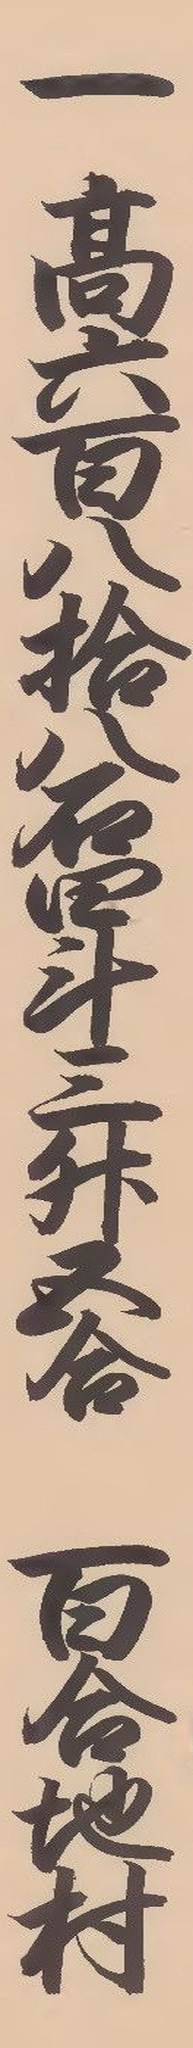一高六百八拾八石四斗三升五合百合地村
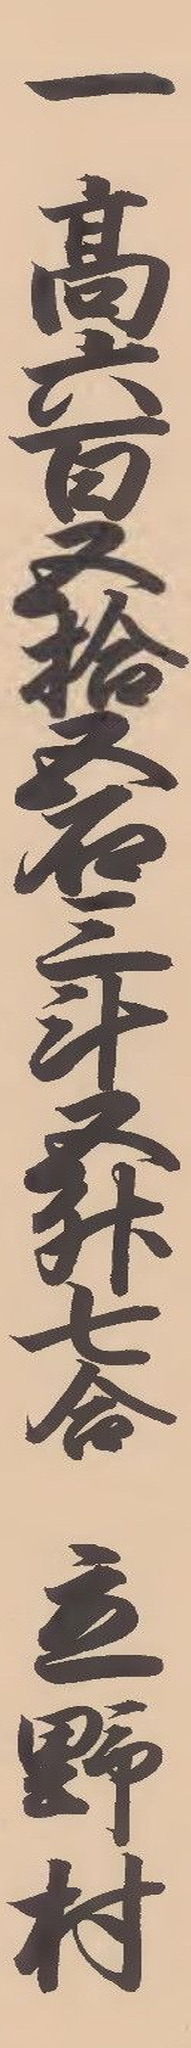一高六百五拾五石三斗五升七合立野村
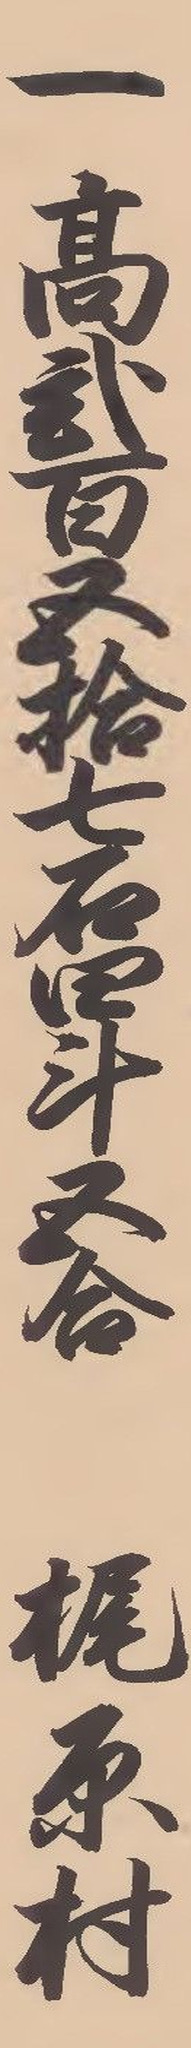一高弐百五拾七石四斗五合梶原村
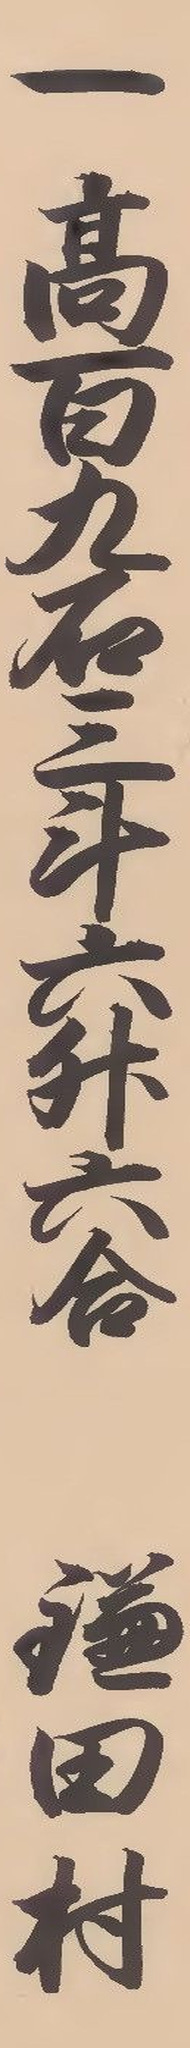一高百九石三斗六升六合鎌田村
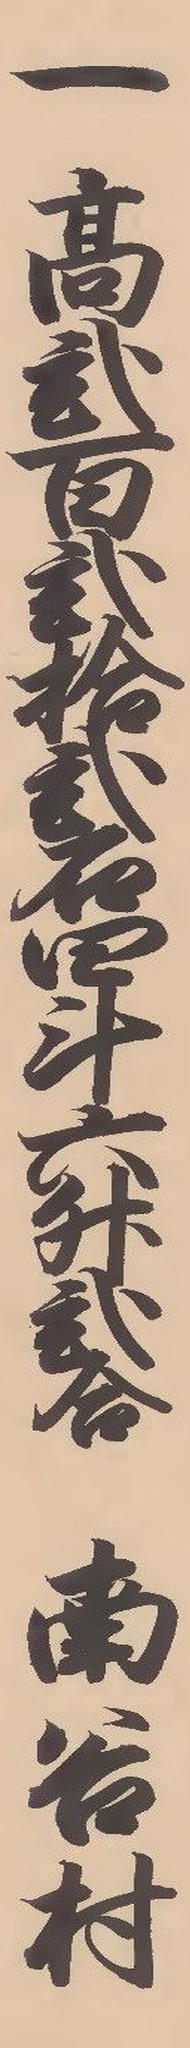一高弐百弐拾弐石四斗六升弐合南谷村
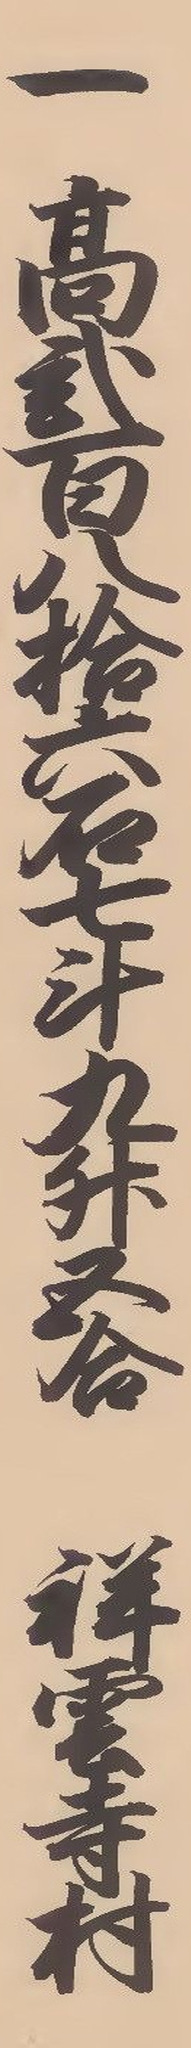一高弐百八拾六石七斗九升五合祥雲寺村

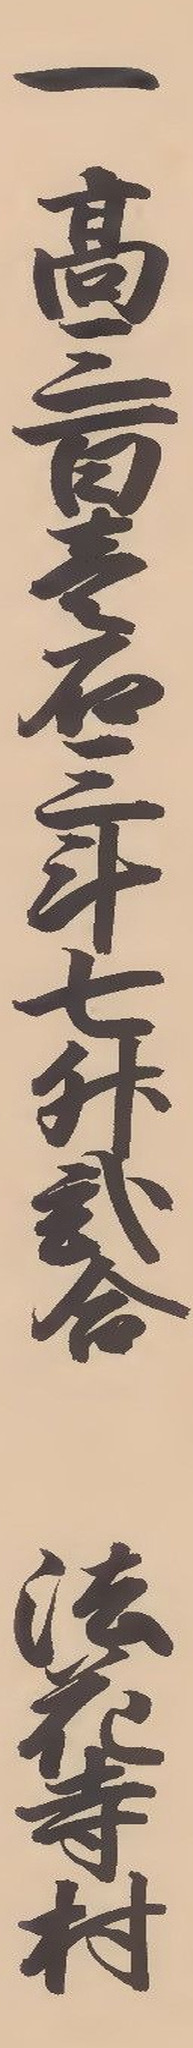一高三百壱石三斗七升弐合法花寺村
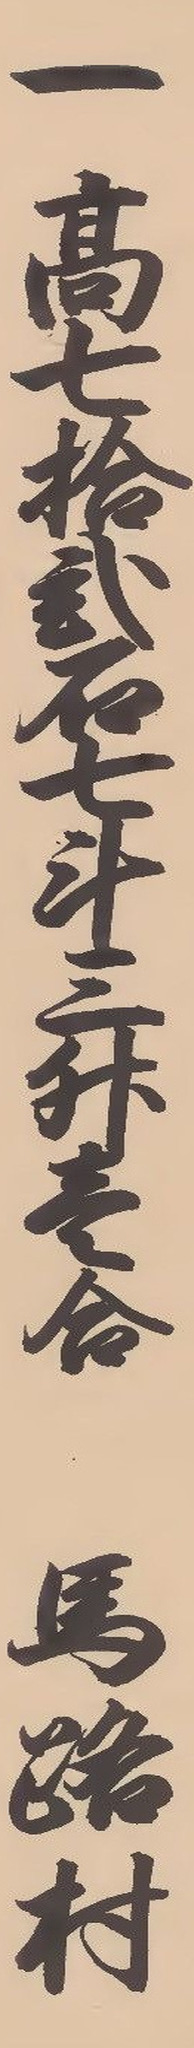一高七拾弐石七斗三升壱合馬路村
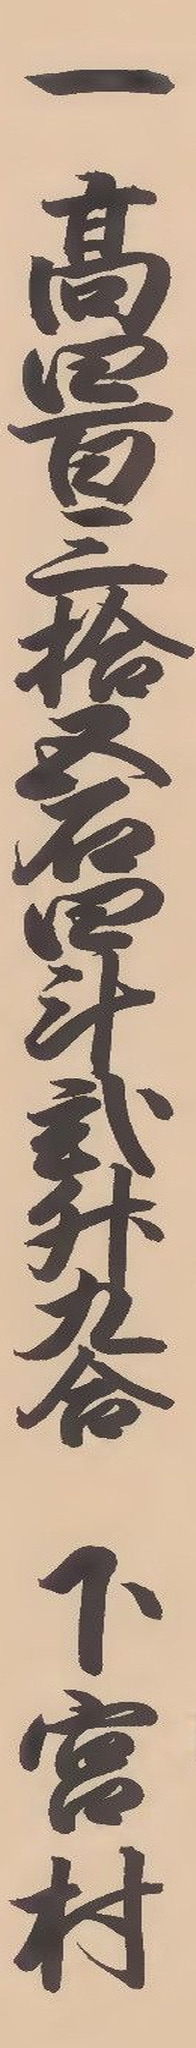一高四百三拾五石四斗弐升九合下宮村
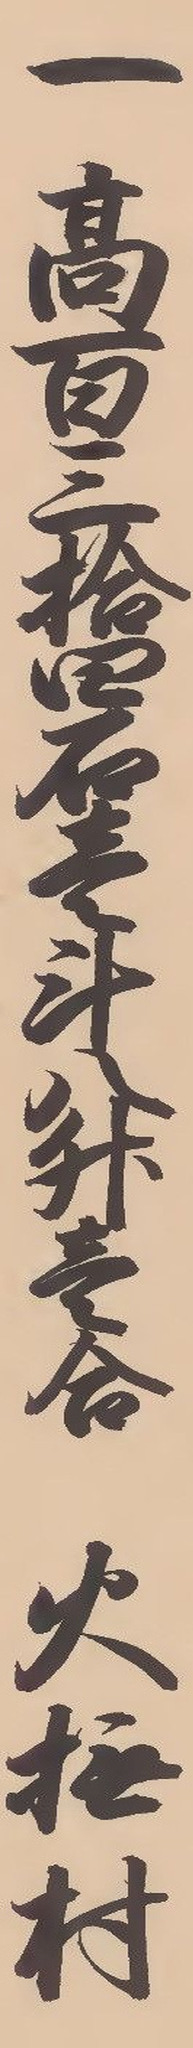一高百三拾四石壱斗八升壱合火撫村
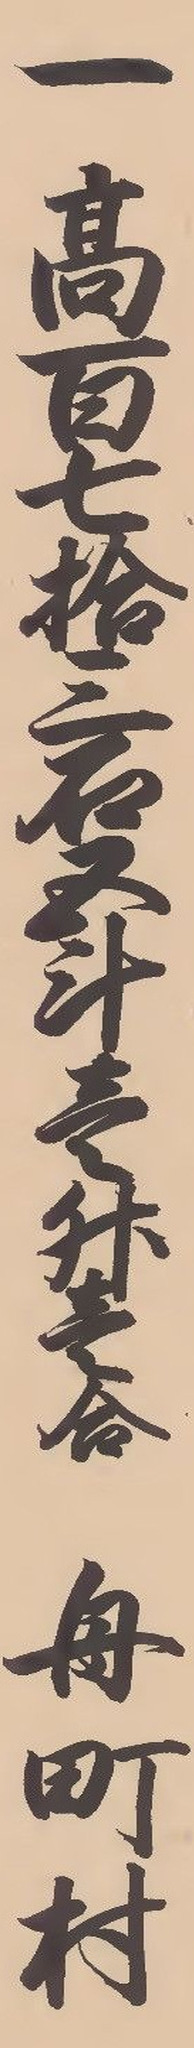一高百七拾三石五斗壱升壱合舟町村
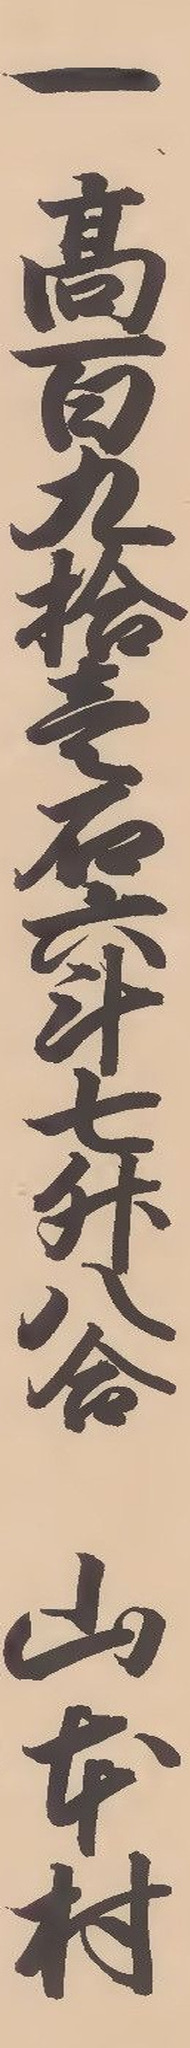一高百九拾壱石六斗七升八合山本村
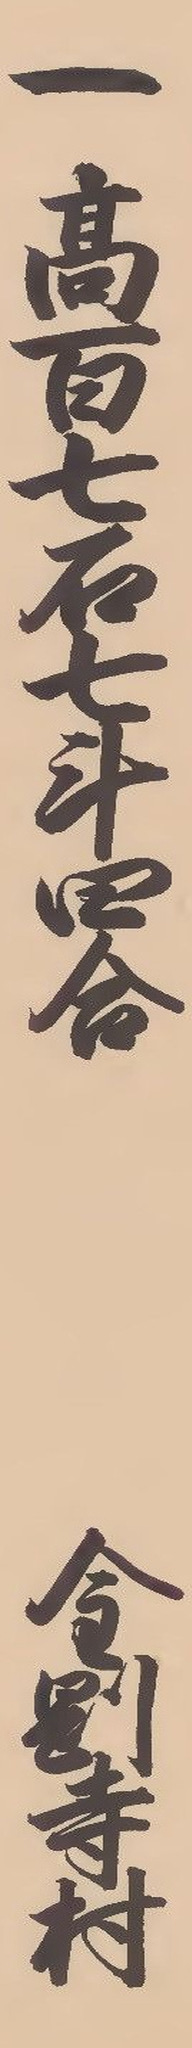一高百七石七斗四合金剛寺村
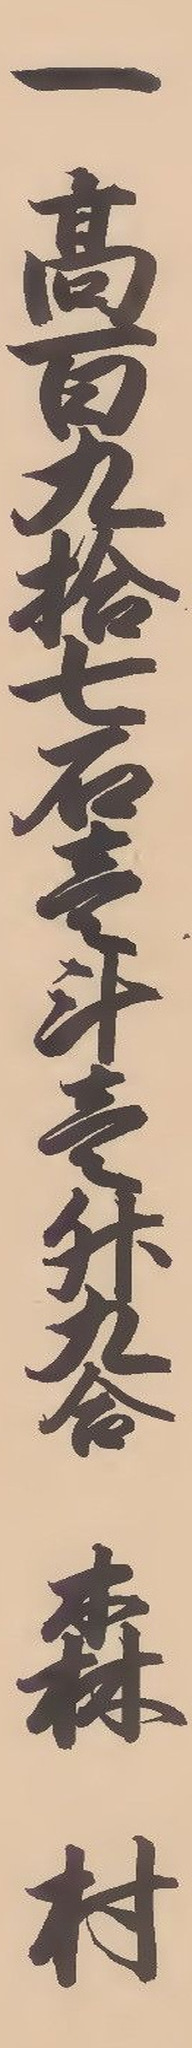一高百九拾七石壱斗壱升九合森村

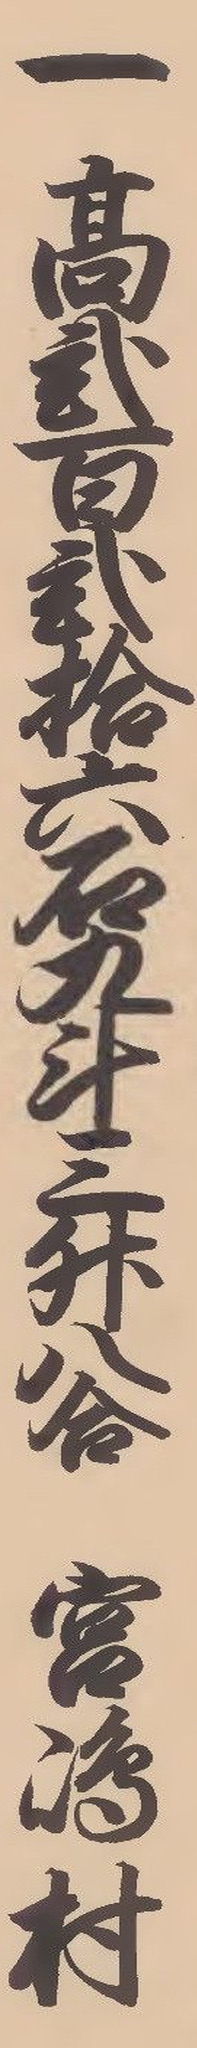一高弐百弐拾六石九斗三升八合宮嶋村
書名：但馬国郷帳
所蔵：国立公文書館 National Archives of Japan
